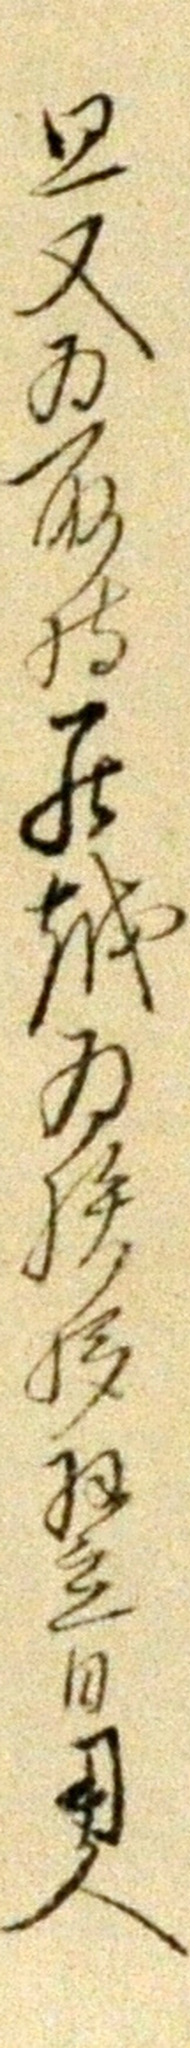且又為取持罷越為挨拶翌日用人
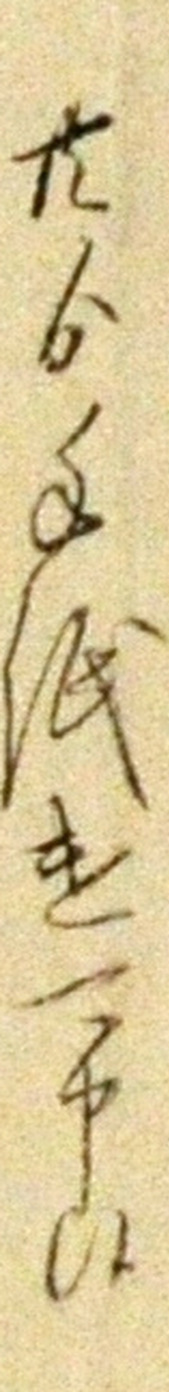共ゟ手紙遣可申候
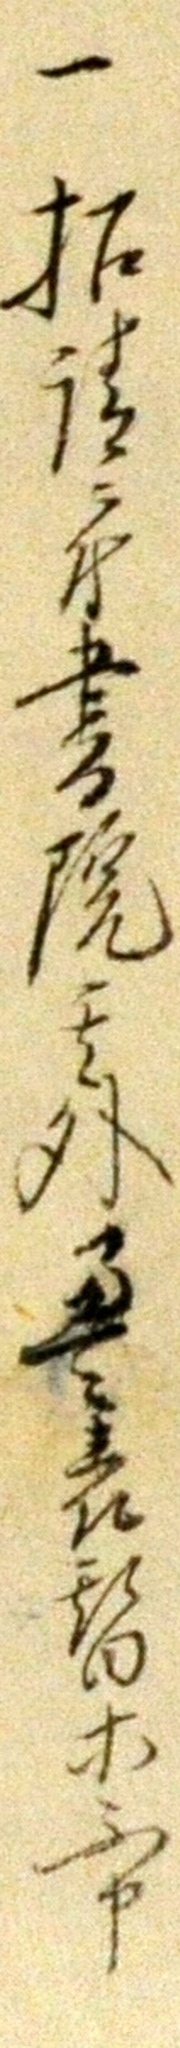一招請ニ付書院其外畳表替等不申
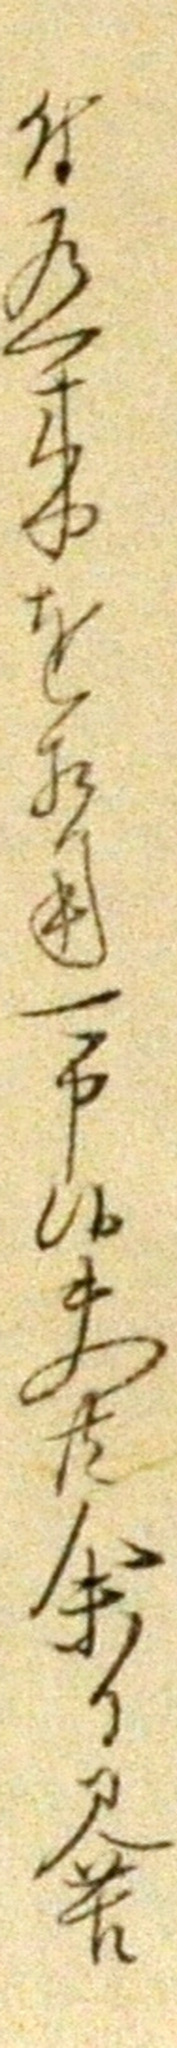付有来を相用可申候夫共余り見苦
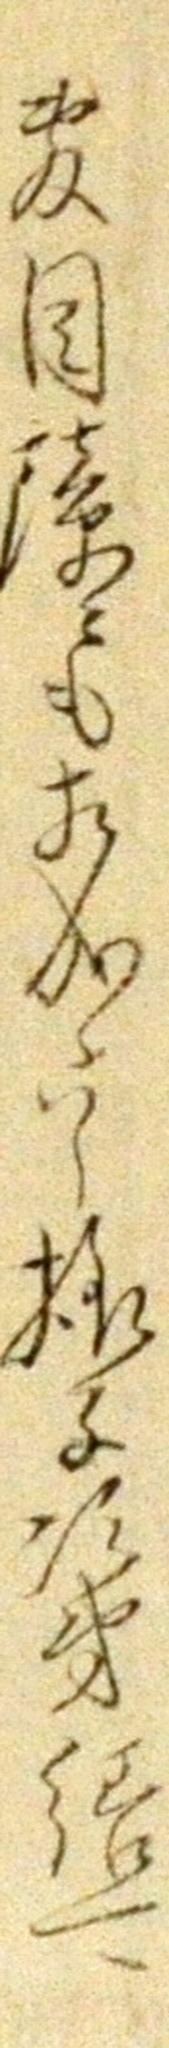敷目障ニ相成候ハヽ様子次第繕可
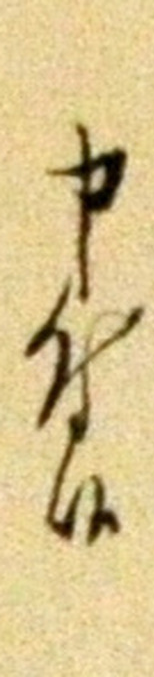申付候
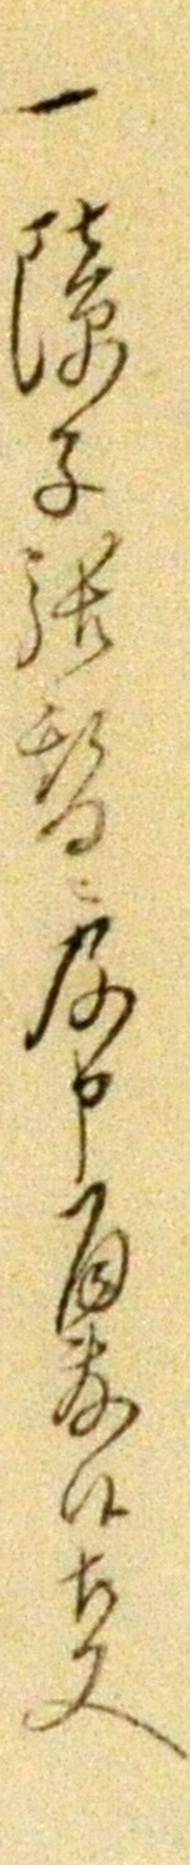一障子張替ニ及申間敷候事
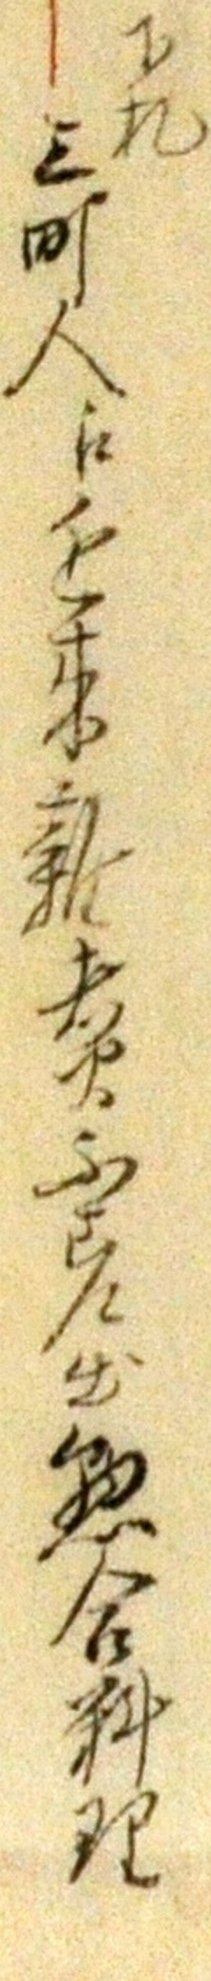三町人え近来雑煮不差出懸合料理
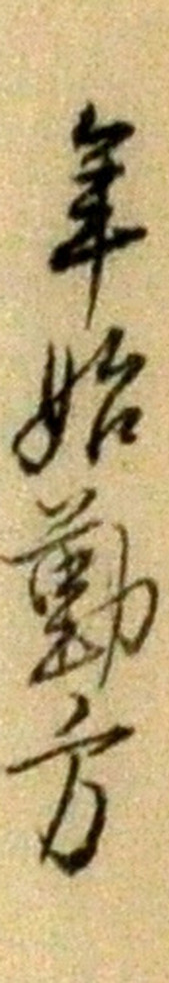年始勤方
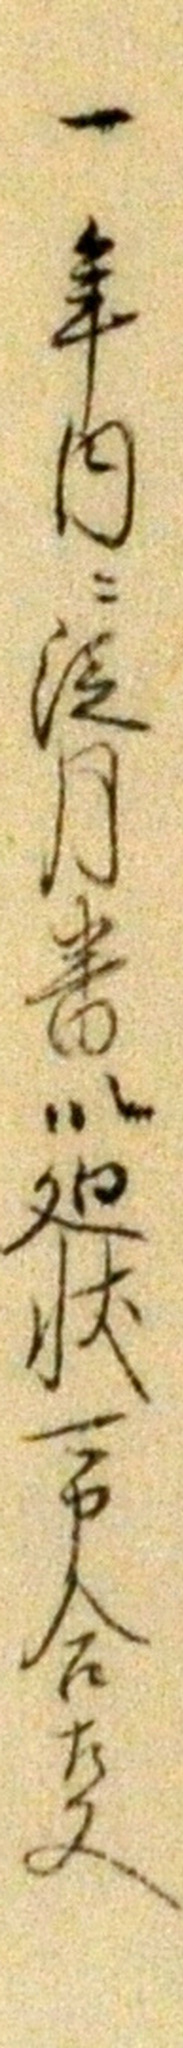一年内ニ従月番以廻状可申合事
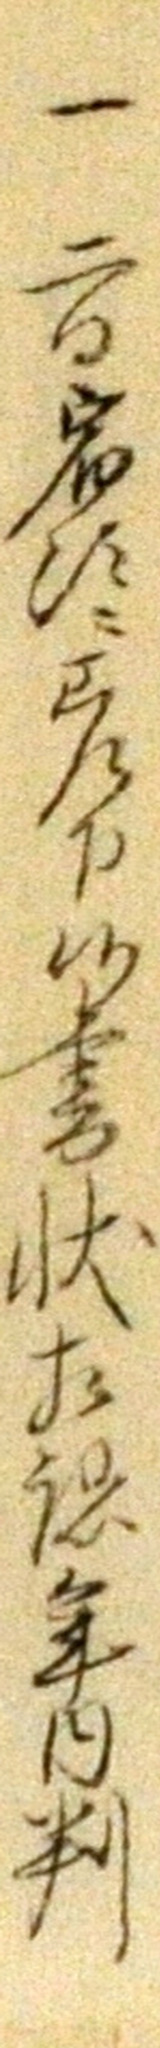一二日宿頭ニ差下候書状相認年内判
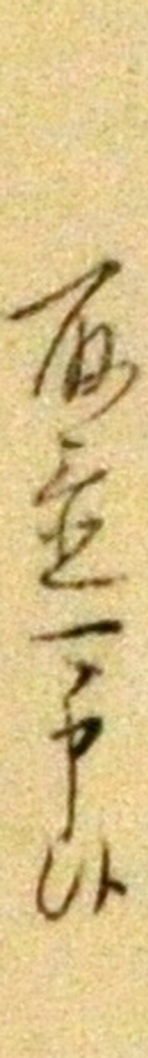取置可申候
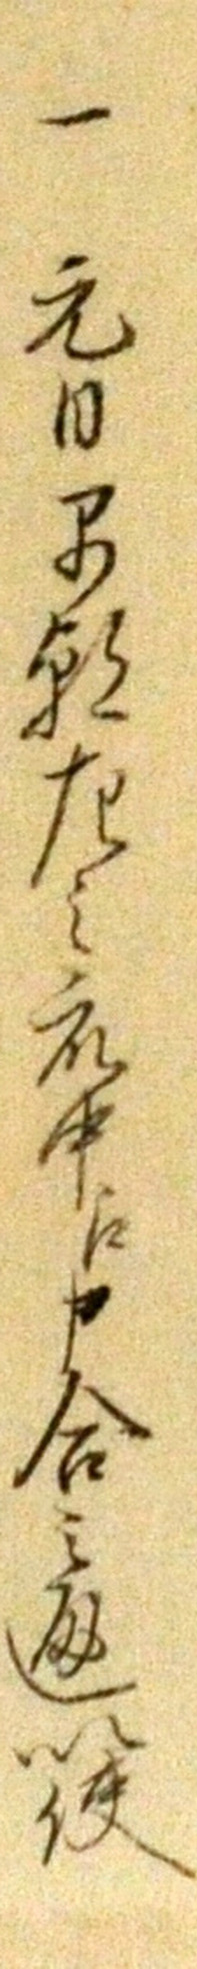一元日早朝左之衆中え申合之通以使
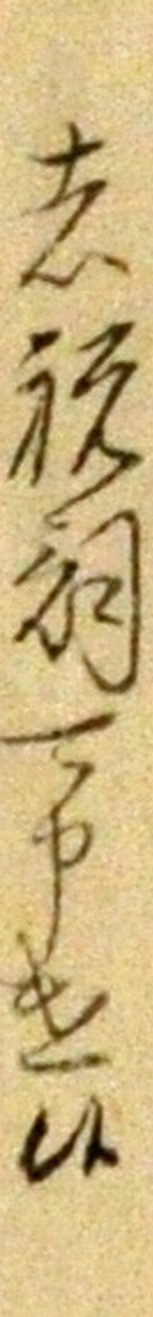者祝詞可申遣候
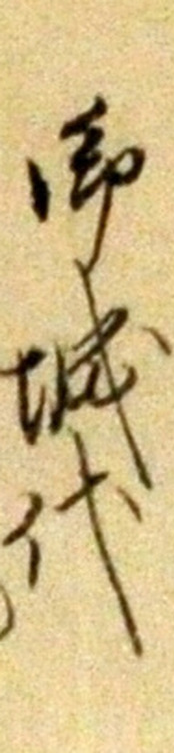御城代
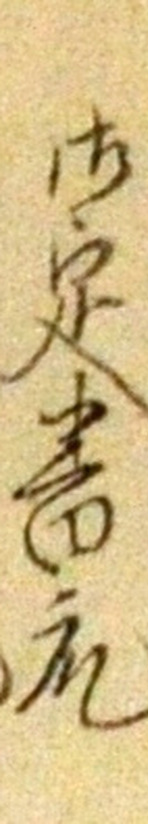御定番衆
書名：大阪加番関係諸書留〔一括〕
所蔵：伊那市立高遠町図書館・合同会社AMANE
